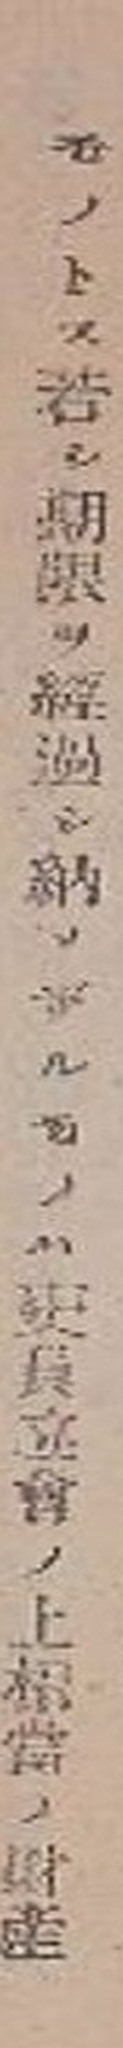モノトス若シ期限ヲ經過シ納メザルモノハ吏員立會ノ上相當ノ財産
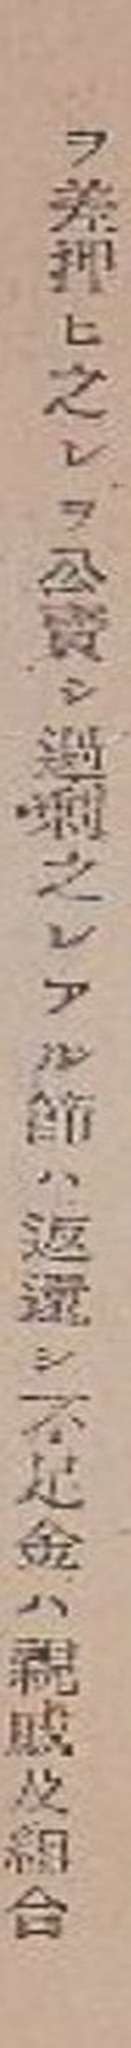ヲ差押ヒ之レヲ公賣シ過剰之レアル節ハ返還シ不足金ハ親戚及組合
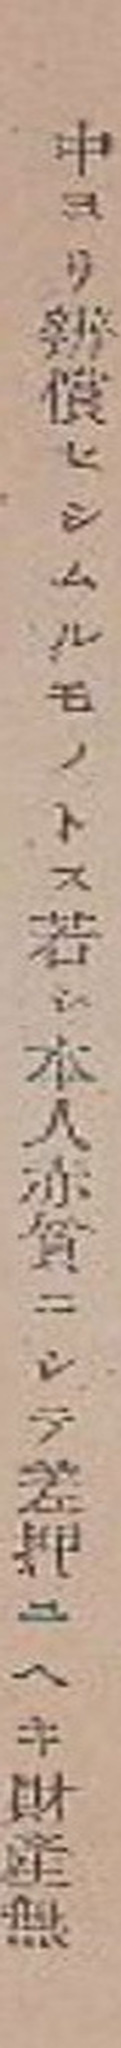中ヨリ辨償セシムルモノトス若シ本人赤貧ニシテ差押ユヘキ財産無
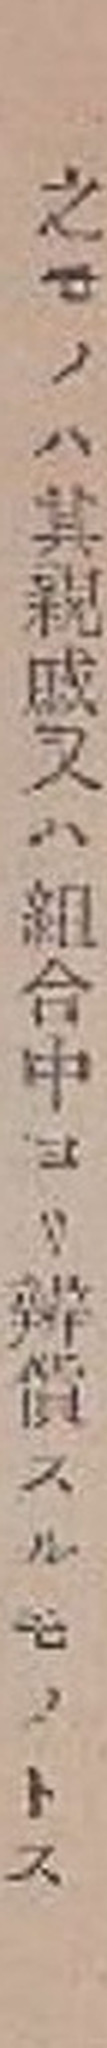之モノハ其親戚又ハ組合中ヨリ辨償スルモノトス
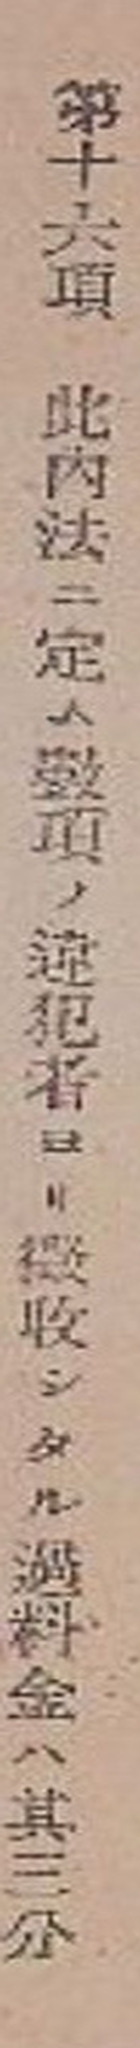第十六項此内法ニ定ム數項ノ違犯者ヨリ徴收シタル過料金ハ其三分
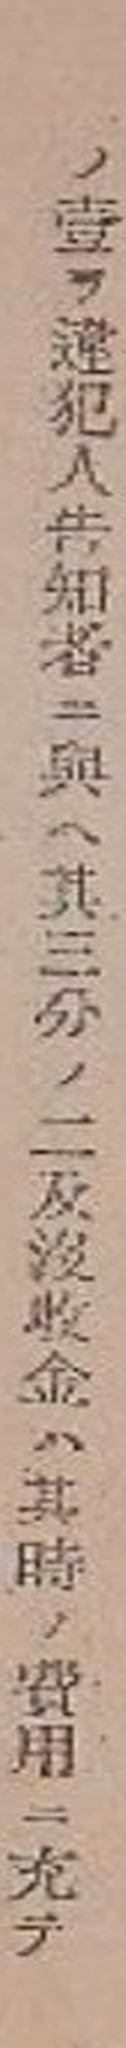ノ壹ヲ違犯人告知者ニ與ヘ其三分ノ二及没收金ハ其時ノ費用ニ充テ

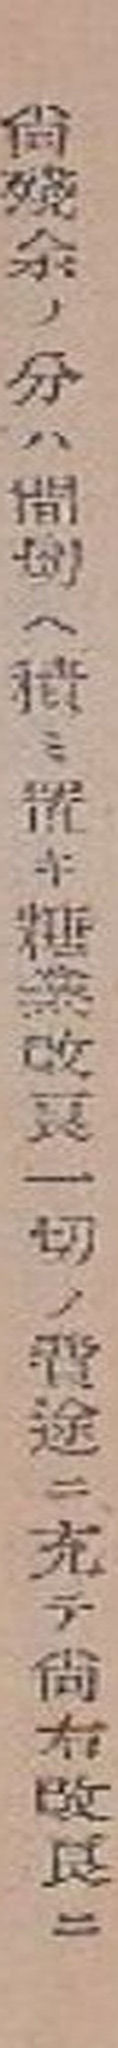尚残余ノ分ハ間切ヘ積ミ置キ糖業改良一切ノ費途ニ充テ尚右改良ニ
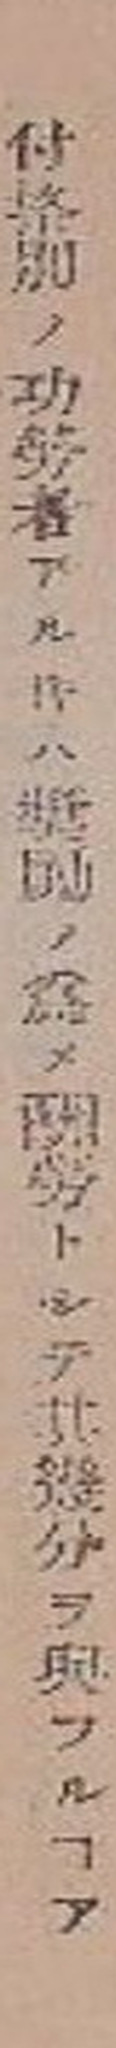付格別ノ功労者アルトキハ奨励ノ爲メ労トシテ其幾分ヲ與フルヿア
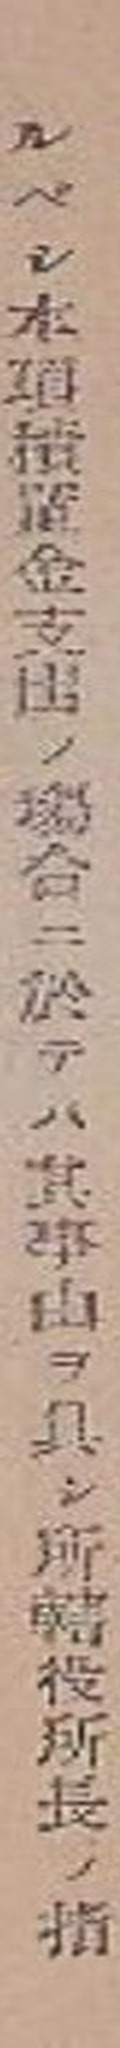ルベシ本項積置金支出ノ場合ニ於テハ其事由ヲ具シ所轄役所長ノ指
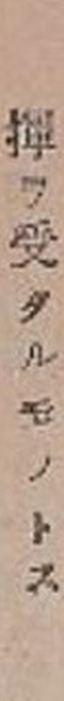揮ヲ受クルモノトス
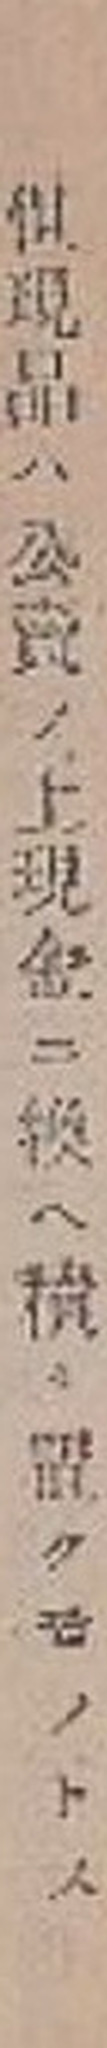但現品ハ公賣ノ上現金ニ換ヘ積ミ置クモノトス
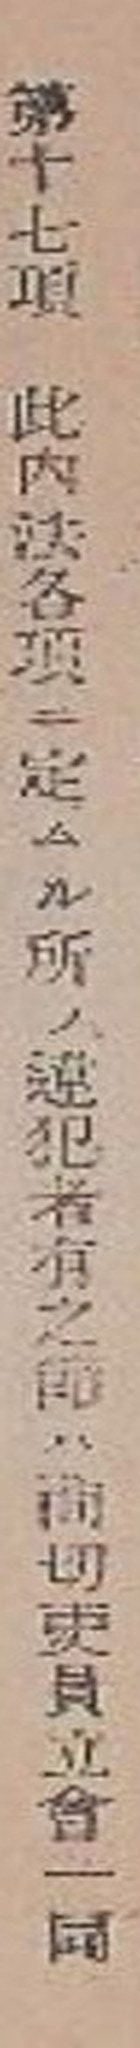第十七項此内法各項ニ定ムル所ノ違犯者有之節ハ間切吏員立會一同
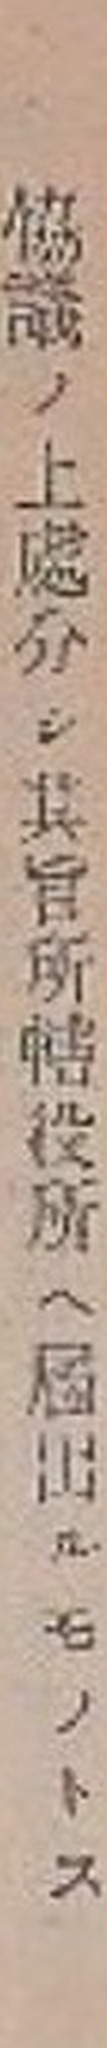協議ノ上處分シ其旨所轄役所ヘ届出ルモノトス
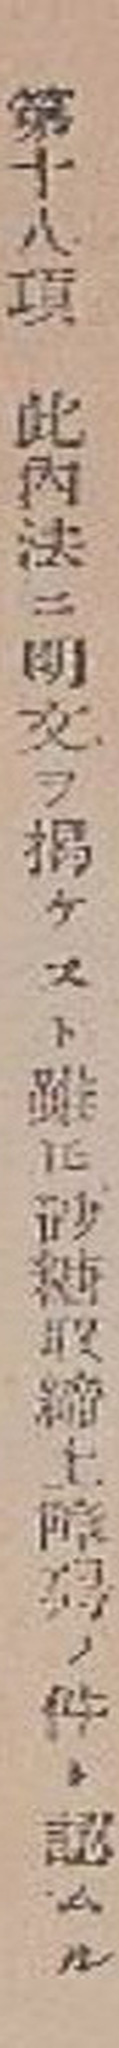第十八項此内法ニ明文ヲ掲ケスト雖トモ砂糖取締上障碍ノ件ト認ムル
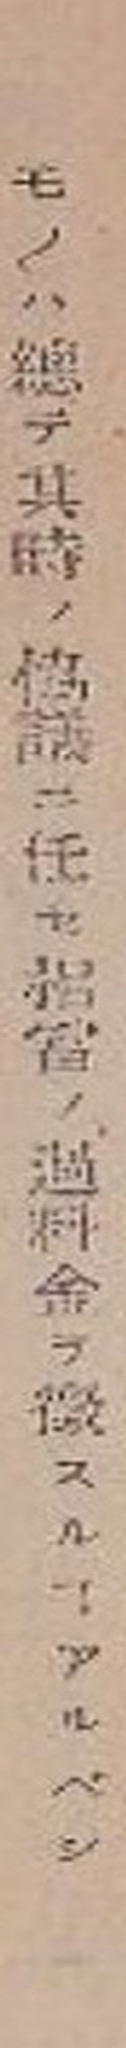モノハ總テ其時ノ協議ニ任セ相當ノ過料金ヲ徴スルヿアルベシ
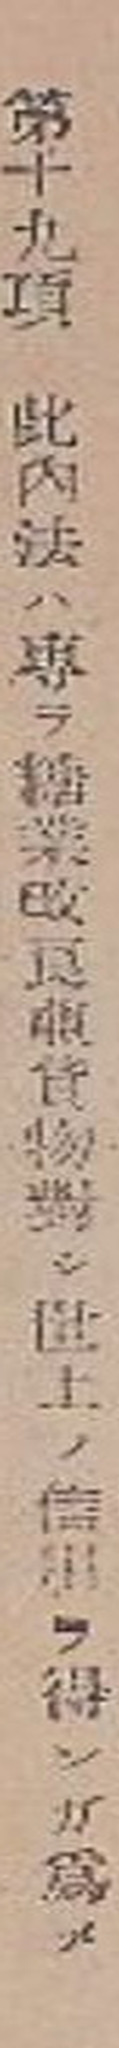第十九項此内法ハ専ラ糖業改良並貨物對シ世上ノ信用ヲ得ンガ爲メ
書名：製糖取締旧慣内法
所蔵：University of the Ryukyus Library
